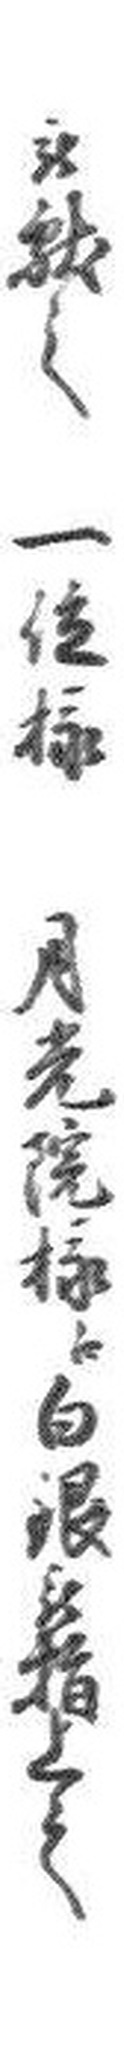被献之一位様月光院様江白銀被指上之

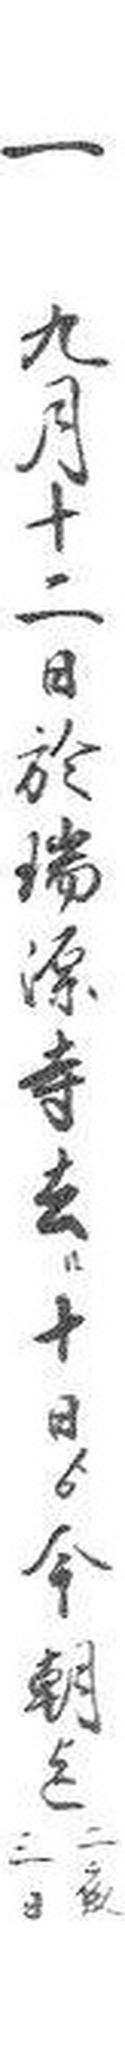一九月十二日於瑞源寺去ル十日ゟ今朝迄二夜三日
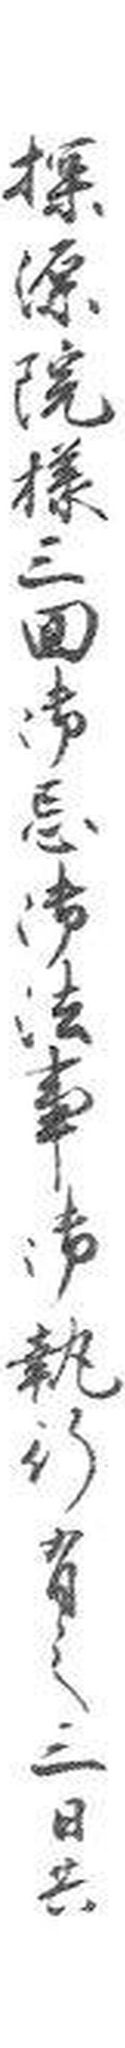探源院様三回御忌御法事御執行有之三日共
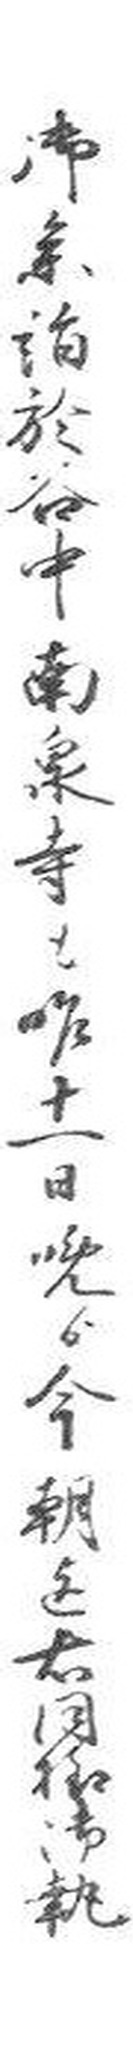御参詣於谷中南泉寺も昨十一日晩ゟ今朝迄右同断御執
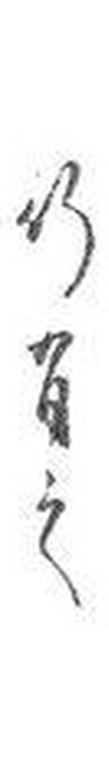行有之
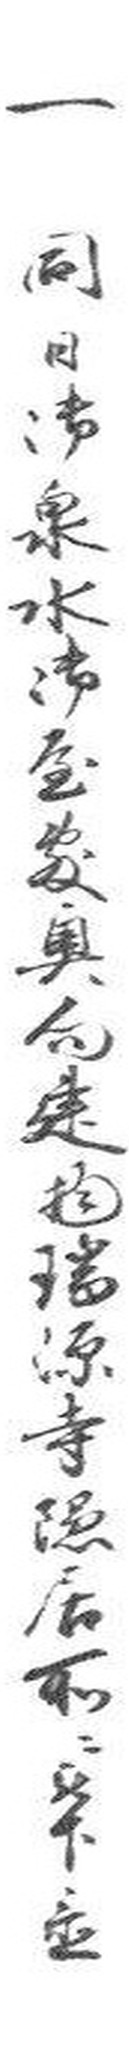一同日御泉水御屋敷奥向建物瑞源寺隠居所ニ被下置
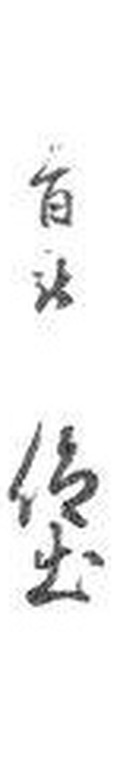旨被仰出
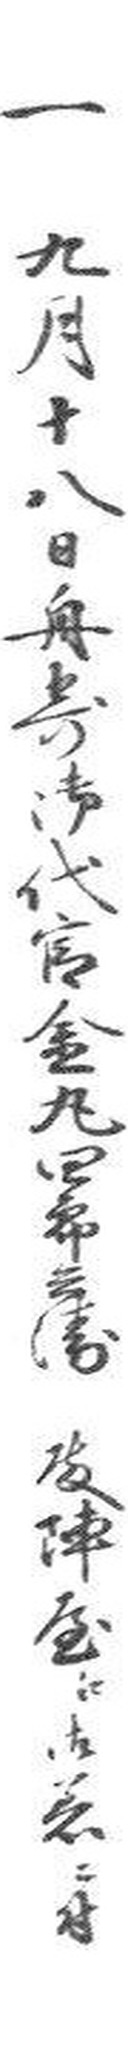一九月十八日舟寄御代官金丸四郎兵衛殿陣屋江御着ニ付
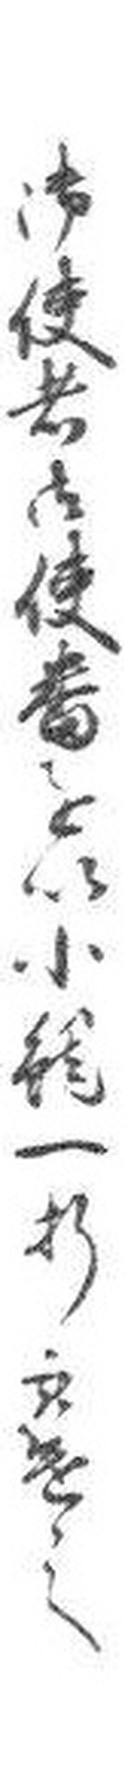御使者御使番を以小鯛一折被遣之
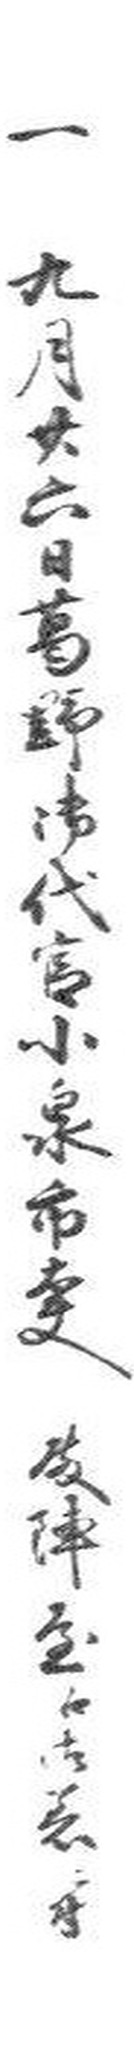一九月廿六日葛野御代官小泉市太夫殿陣屋江御着ニ付
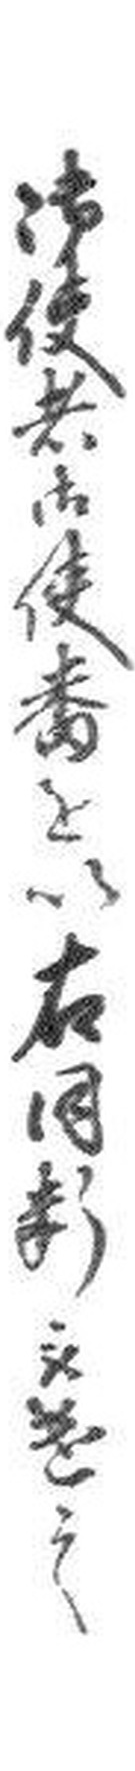御使者御使番を以右同断被遣之
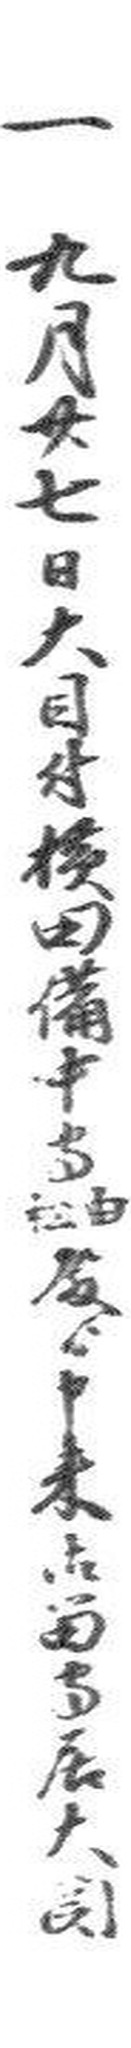一九月廿七日大目付横田備中守由松殿ゟ申来御留守居大関
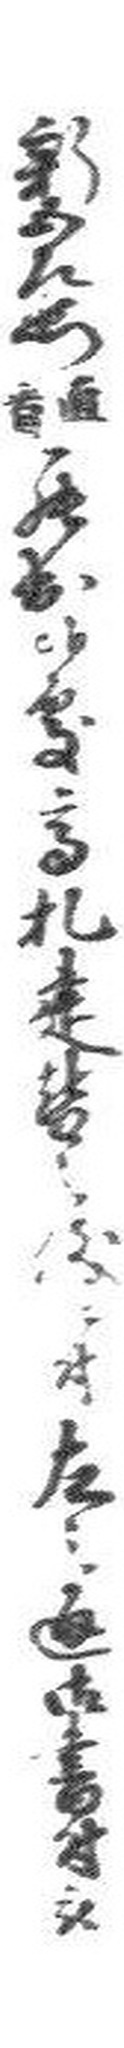新五左衛門直看罷出候処高札立替之儀ニ付左之通御書付被
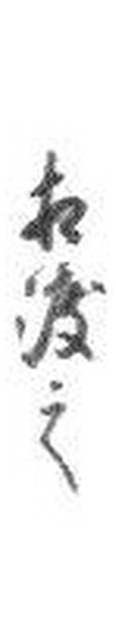相渡之
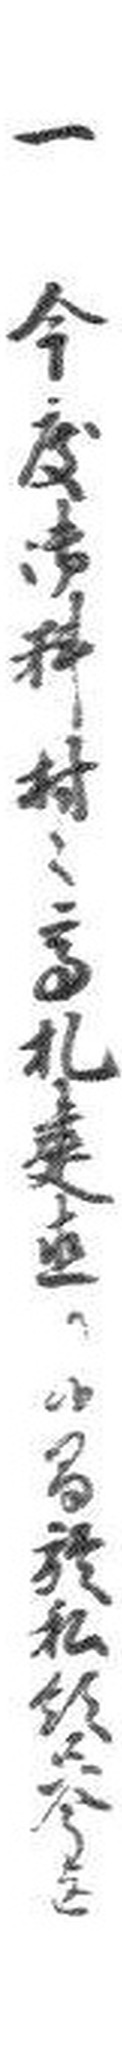一今度御料村々高札建直リ候間私領只今迄
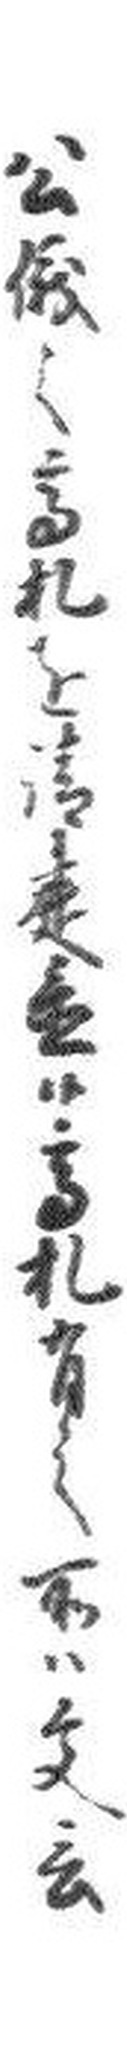公儀之高札を請建直候高札有之所ハ文言
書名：家譜 二十九 吉邦公 従正徳二年到正徳三年
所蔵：福井県文書館 Fukui Prefectural Archives
